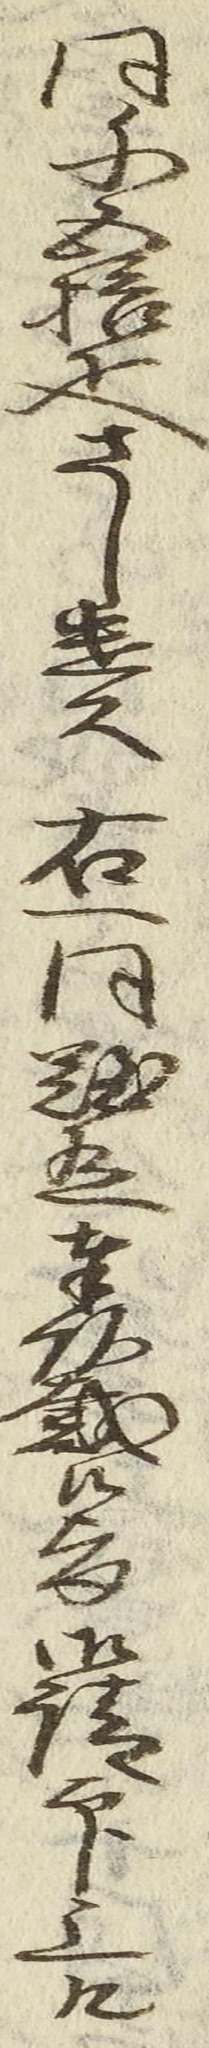同千五拾疋さし遣ス右一同難有奉頂戴候旨御請印上ル

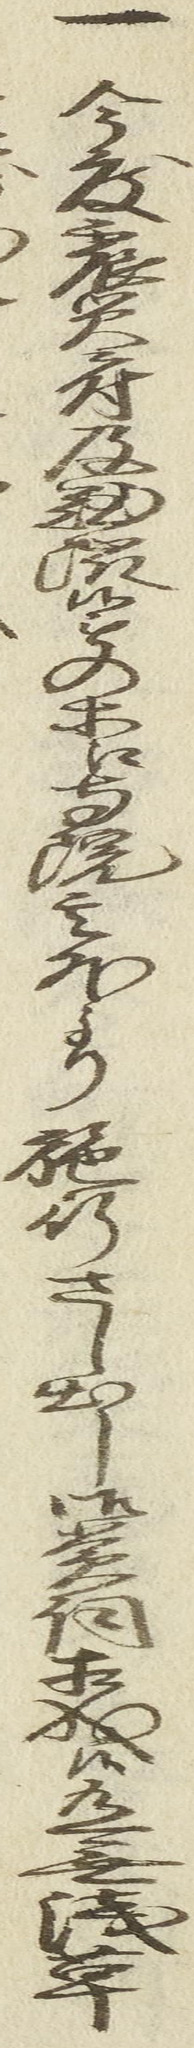一今度震災ニ付及難渋候もの等江寺院其外より施行さし出し御賞詞相成候有無浅草
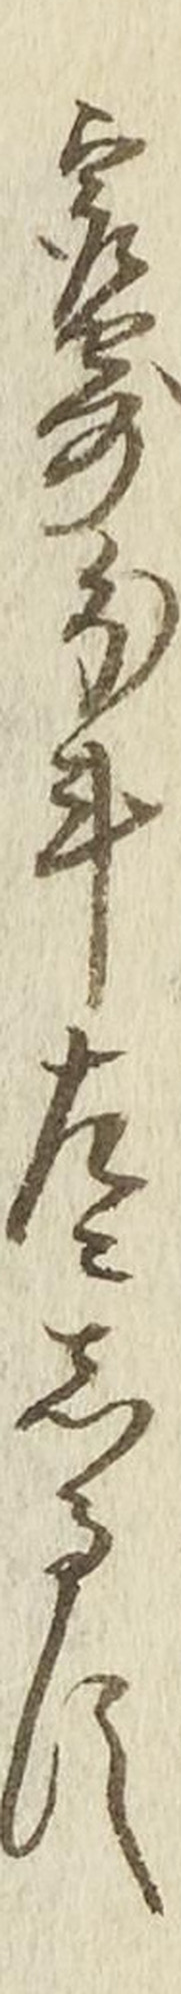最寄分計左ニしるす
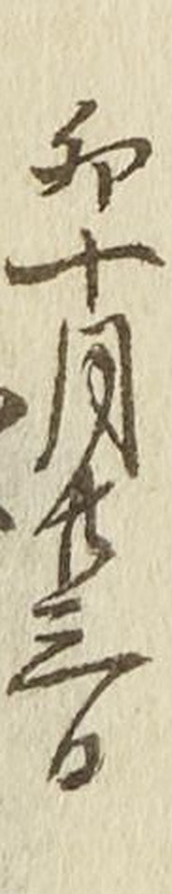卯十月廿三日
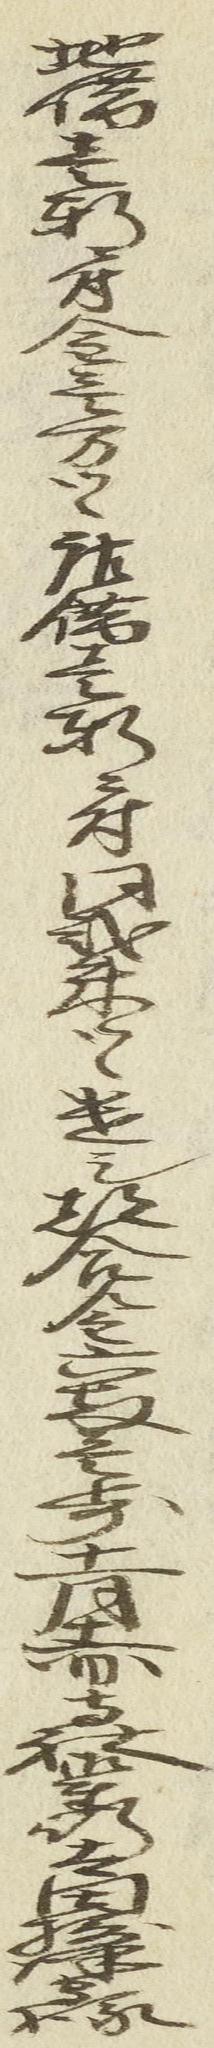地借壱軒ニ付金壱分ツヽ店借壱軒ニ付同弐朱ツヽ遣シ都合金六両壱歩十一月十六日寺社御奉行太田摂津守様
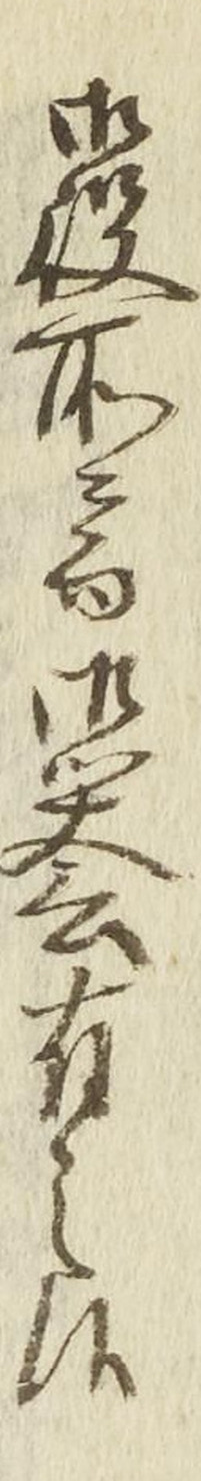御役所ニ而御誉有之候
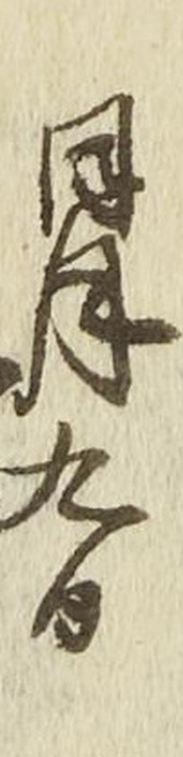同月九日
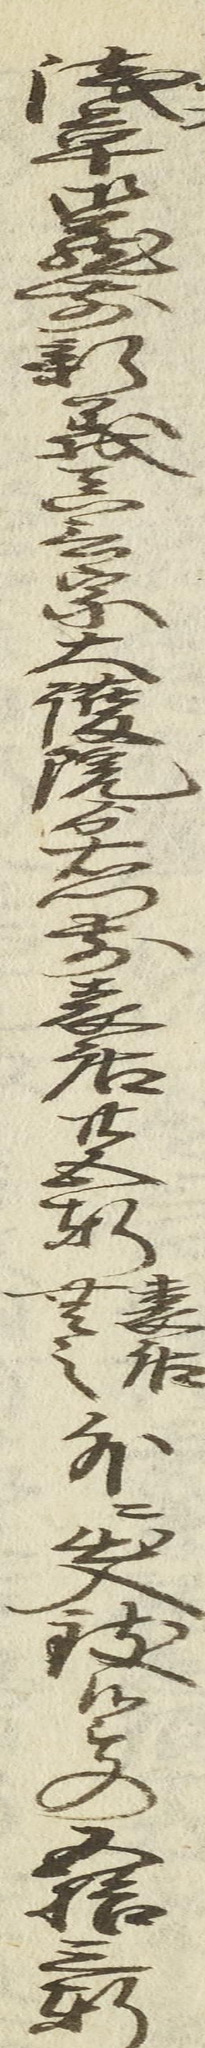一浅草御蔵前新義真言宗大護院ゟ右門前表店廿五軒裏店無之外ニ出入致候もの五拾三軒
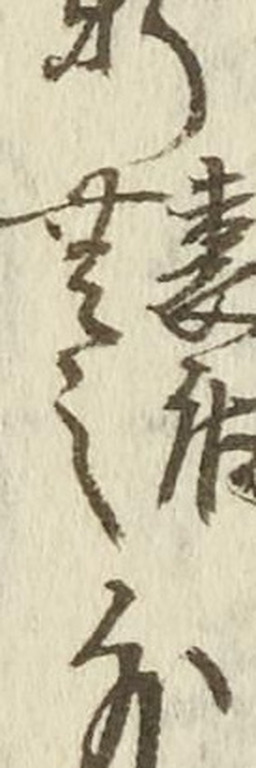有之候
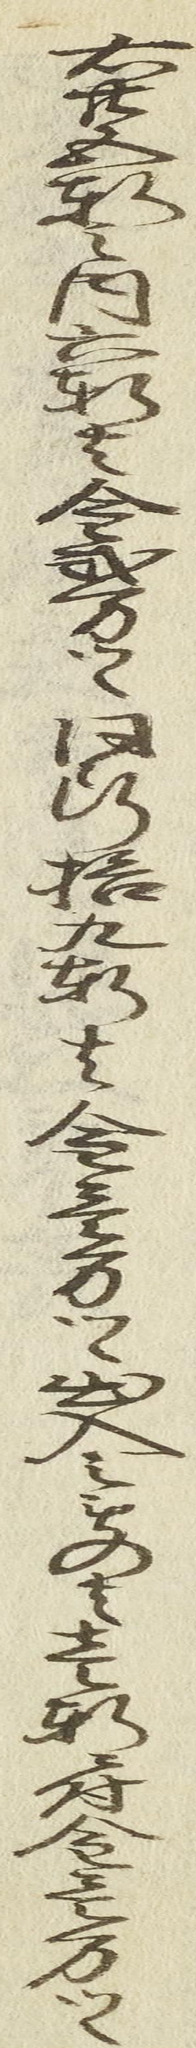右廿五軒之内六軒者金弐分ツヽ同断拾九軒者金壱分ツヽ出入之もの者壱軒ニ付金壱分ツヽ
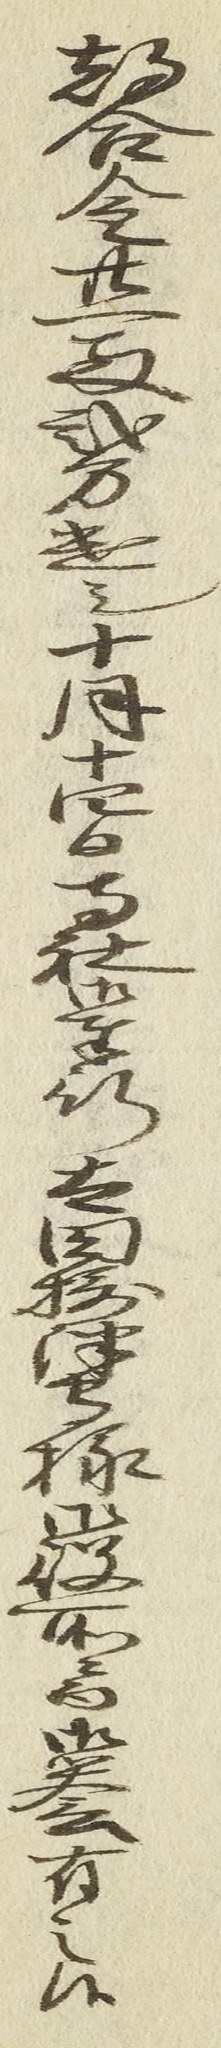都合金廿一両弐分遣シ十月十四日寺社御奉行太田摂津守様御役所ニ而御誉有之候
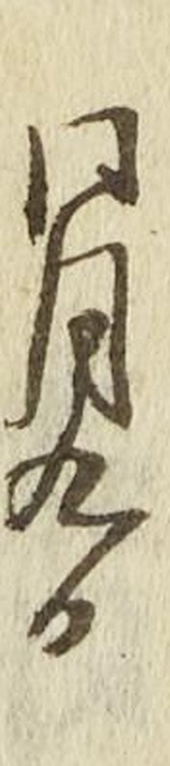同月九日
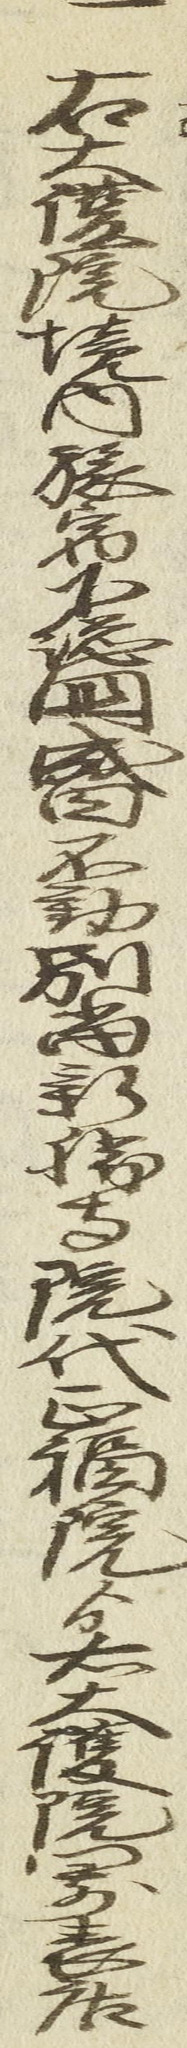一右大護院境内旅宿下総国成田不動別当新勝寺院代正福院ゟ右大護院門前表店
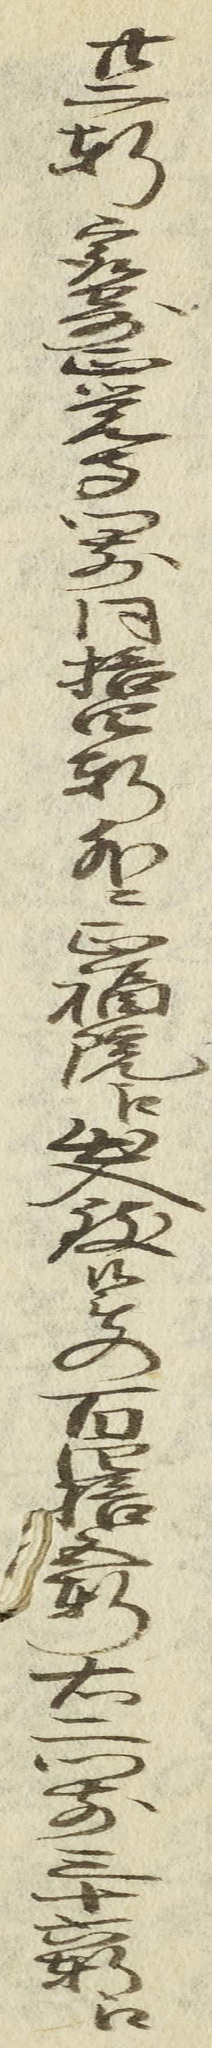廿二軒最寄正覚寺門前同拾四軒外ニ正福院江出入致候もの百四拾五軒右二門前三十六軒江
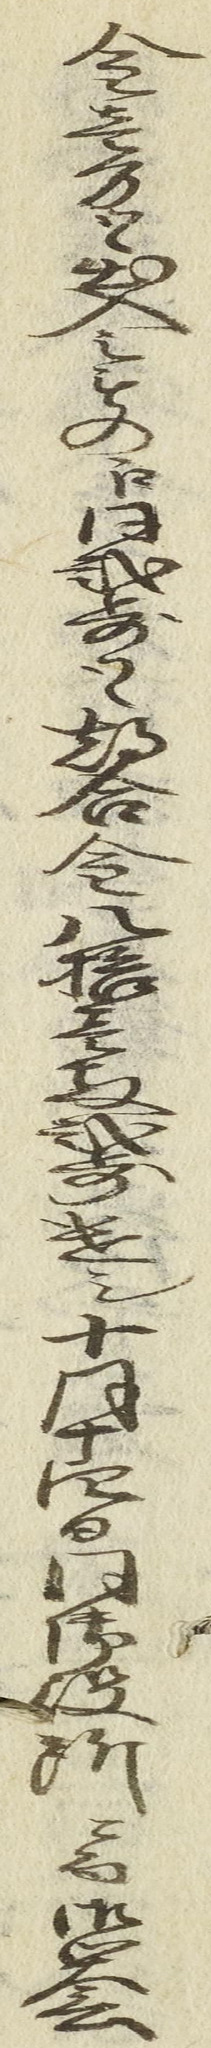金壱分ツヽ出入之もの江同弐歩ツヽ都合金八拾壱両弐歩遣シ十月十四日同御役所ニ而御誉
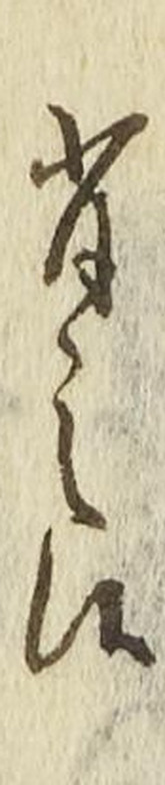有之候
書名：安政二年震災記事　完
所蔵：東京大学地震研究所図書室 Earthquake Research Institute Library, The University of Tokyo, JAPAN
